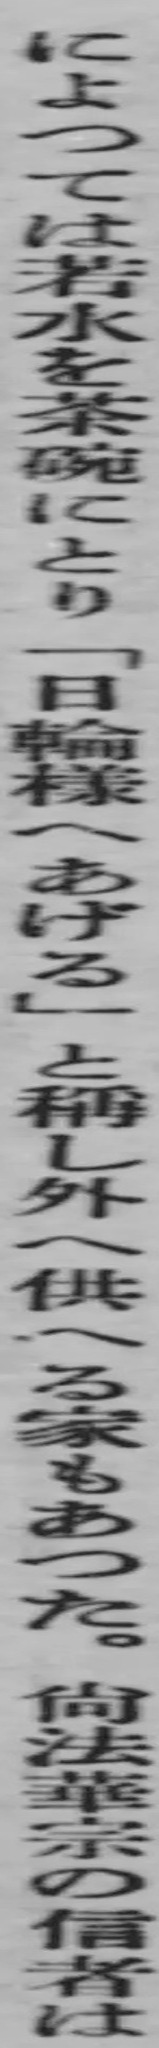によつては若水を茶碗にとり「日輪様へあげる」と稱し外へ供へる家もあつた。尚法華宗の信者は
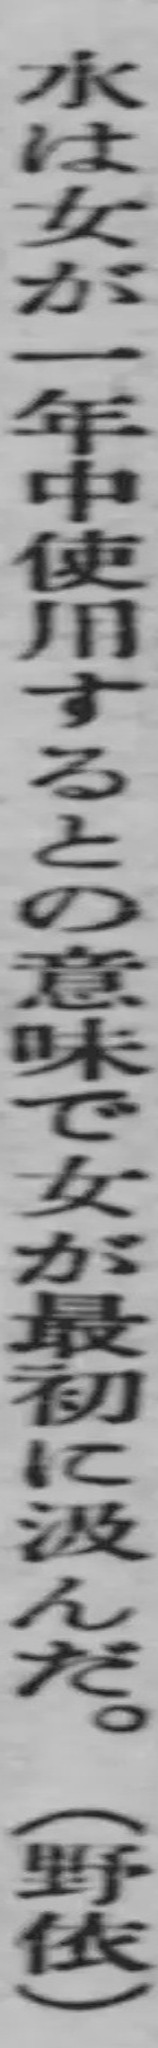水は女が一年中使用するとの意味で女が最初に汲んだ。(野依)
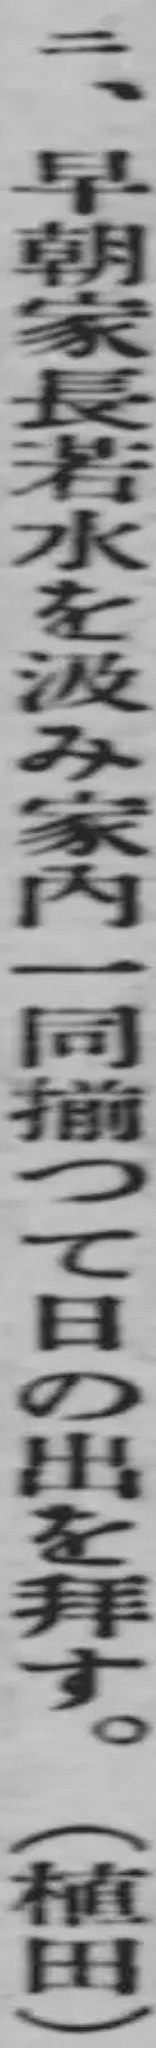ニ、早朝家長若水を汲み家内一同揃つて日の出を拜す。(植田)
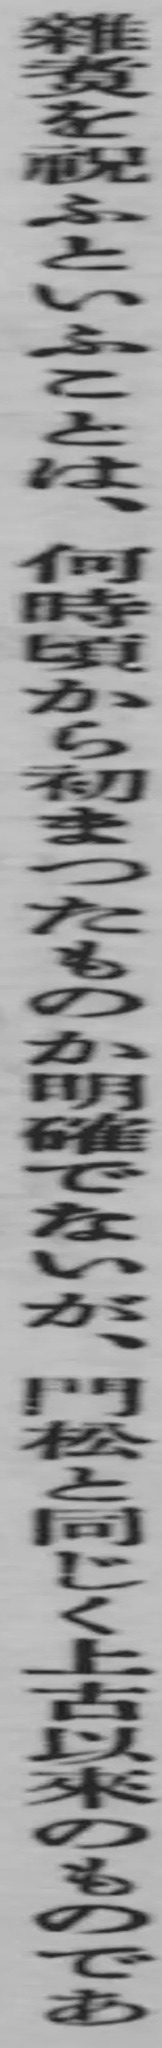雜煮を祝ふといふことは、何時頃から初まつたものか明確でないが、門松と同じく上古以來のものであ
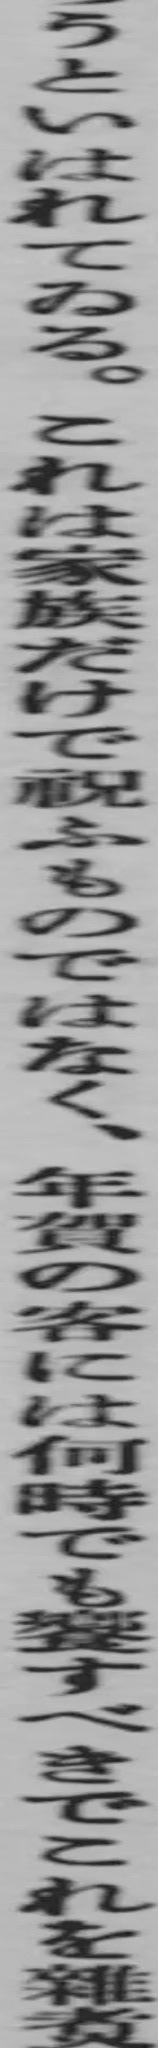らうといはれてゐる。これは家族だけで祝ふものではなく、年賀の客には何時でも饗すべきでこれを雜煮
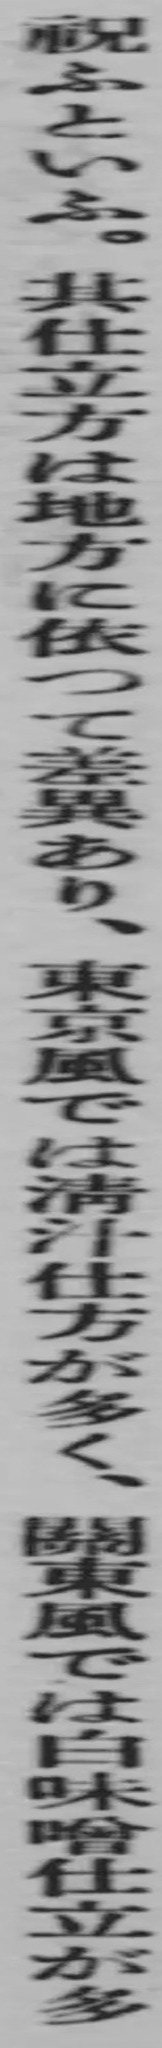祝ふといふ。其仕立方は地方に依つて差異あり、東京風では淸汁仕方が多く、關東風では白味噌仕立が多
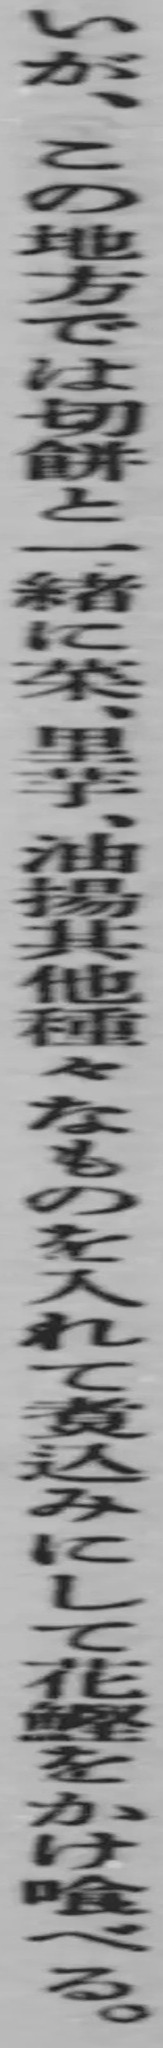いが、この地方では切餅と一緒に菜、里芋、油揚其他種々なものを入れて煑込みにして花鰹をかけ喰べる。
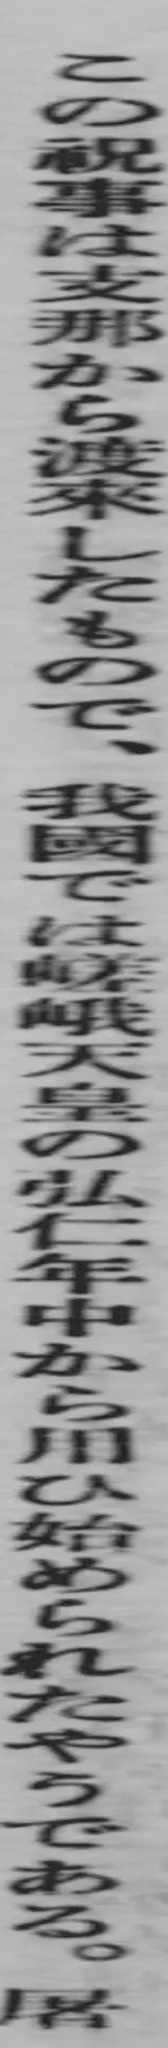この祝事は支那から渡來したもので、我國では嵯峨天皇の弘仁年中から用ひ始められたやうである。屠
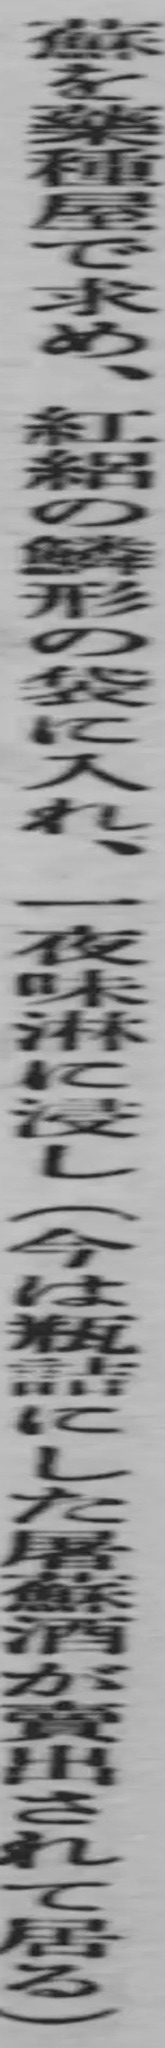蘇を藥種屋で求め、紅絽の鱗形の袋に入れ、一夜味淋に浸し(今は瓶詰にした屠蘇酒が賣出されて居る)
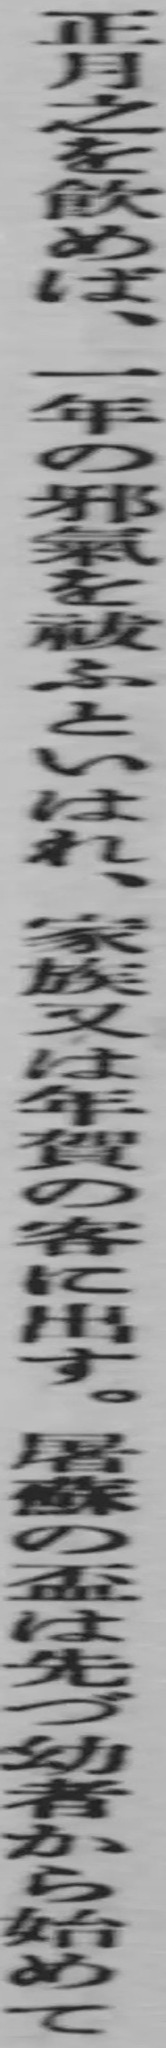正月之を飮めば、一年の邪氣を祓ふといはれ、家族又は年賀の客に出す。屠蘇の盃は先づ幼者から始めて
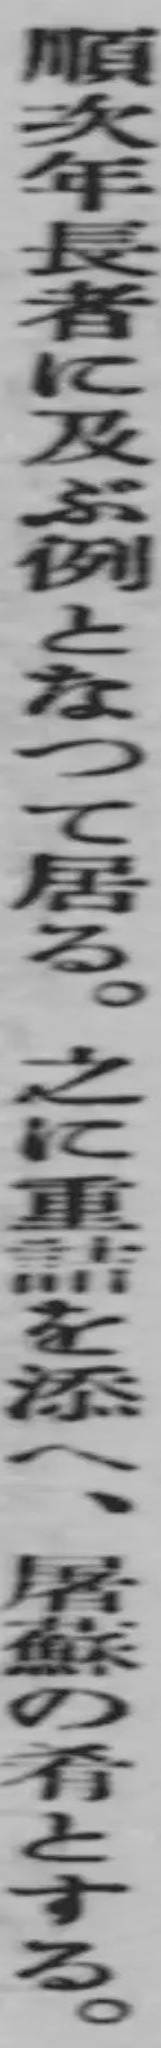順次年長者に及ぶ例となつて居る。之に重詰を添へ、屠蘇の肴とする。
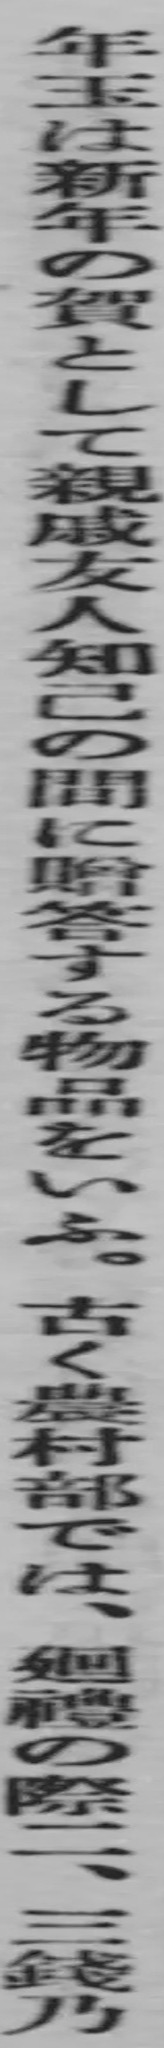年玉は新年の賀として親戚友人知己の間に贈答する物品をいふ。古く農村部では、廻禮の際二、三錢乃
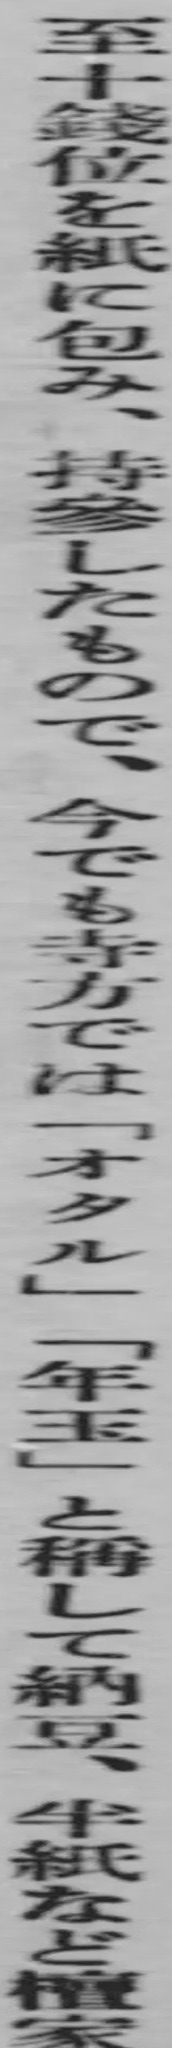至十錢位を紙に包み、持參したもので、今でも寺方では「オタル」「年玉」と稱して納豆、半紙など檀家
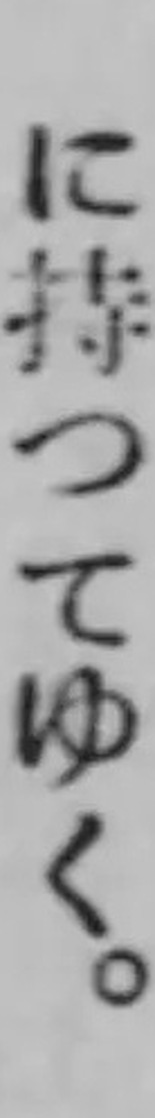に持つてゆく。
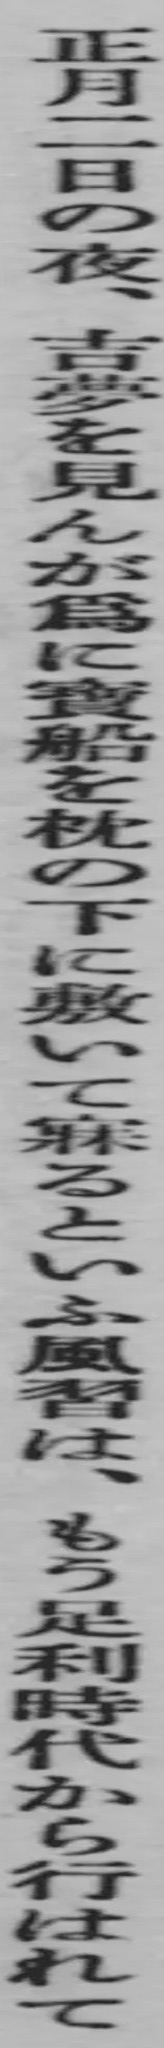正月二日の夜、吉夢を見んが爲に寶船を枕の下に敷いて寐るといふ風習は、もう足利時代から行はれて
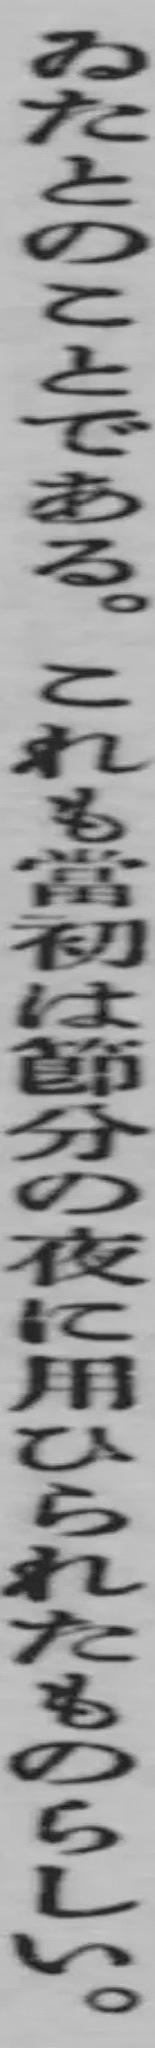ゐたとのことである。これも當初は節分の夜に用ひられたものらしい。
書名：豊橋の年中行事
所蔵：国立国会図書館 National Diet Library, JAPAN
